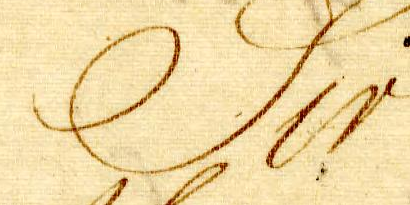Sir
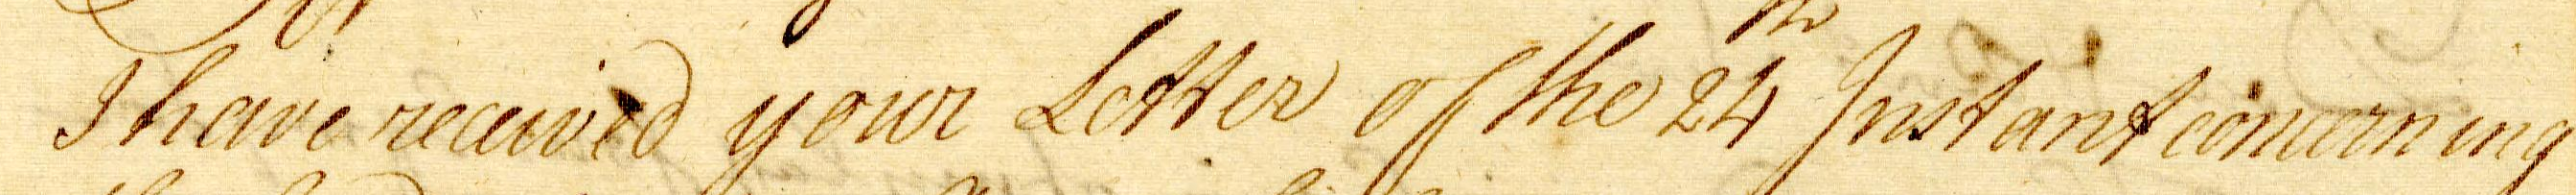I have received your Letter of the 24^th Instant concerning
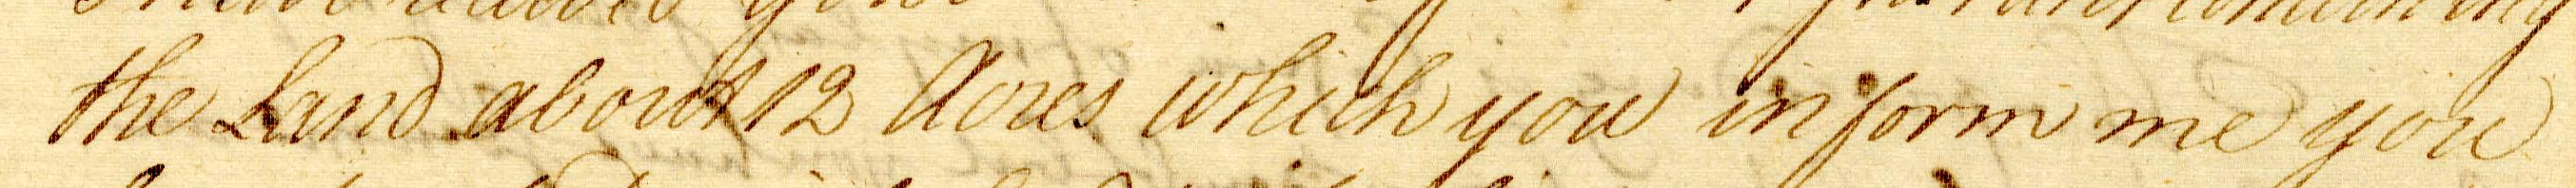the Land about 12 Acres which you inform me you
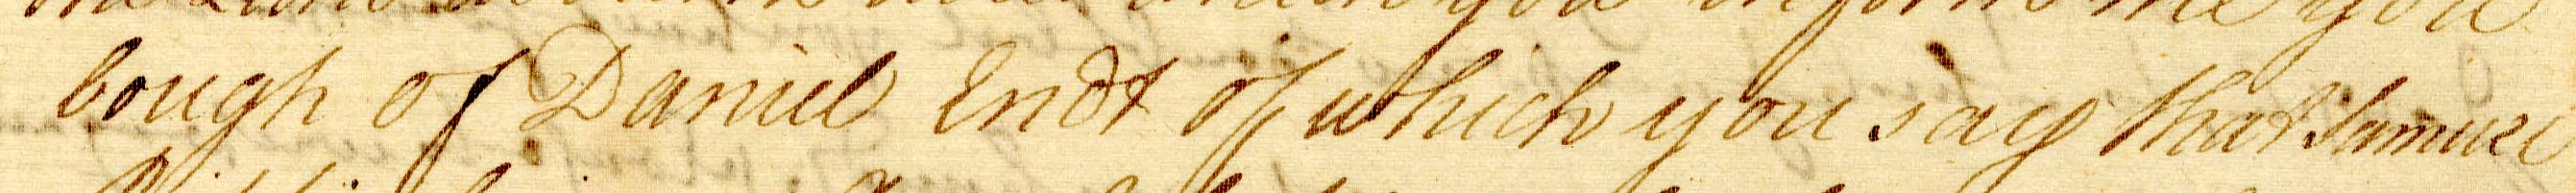bough of Daniel Endt of which you say that Samuel
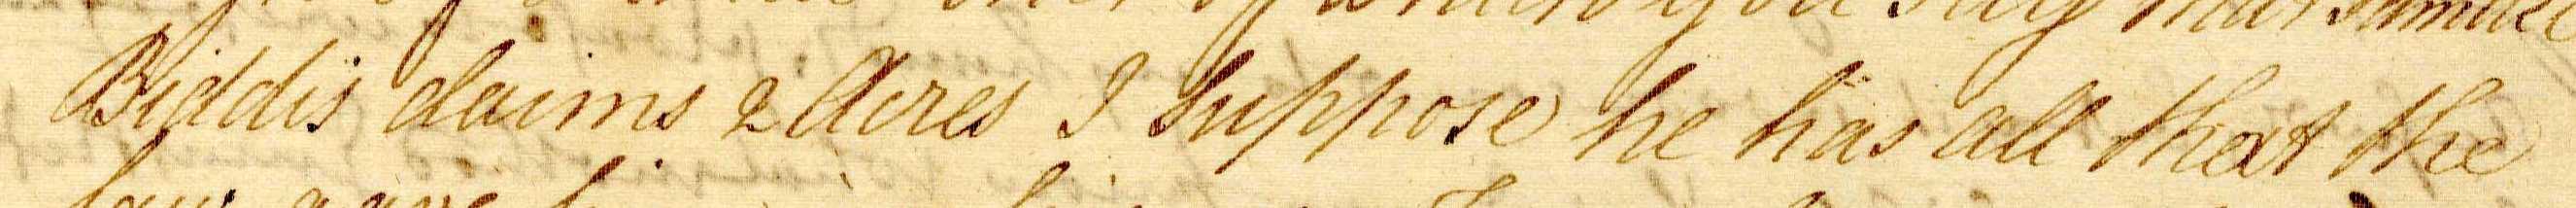Biddis claims 2 Acres I Suppose he has all that the
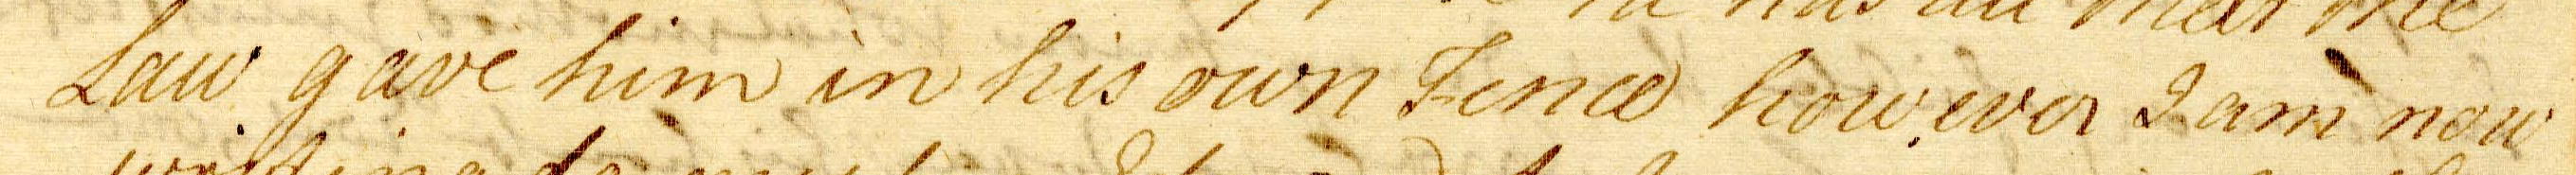Law gave him in his own fence however I am now
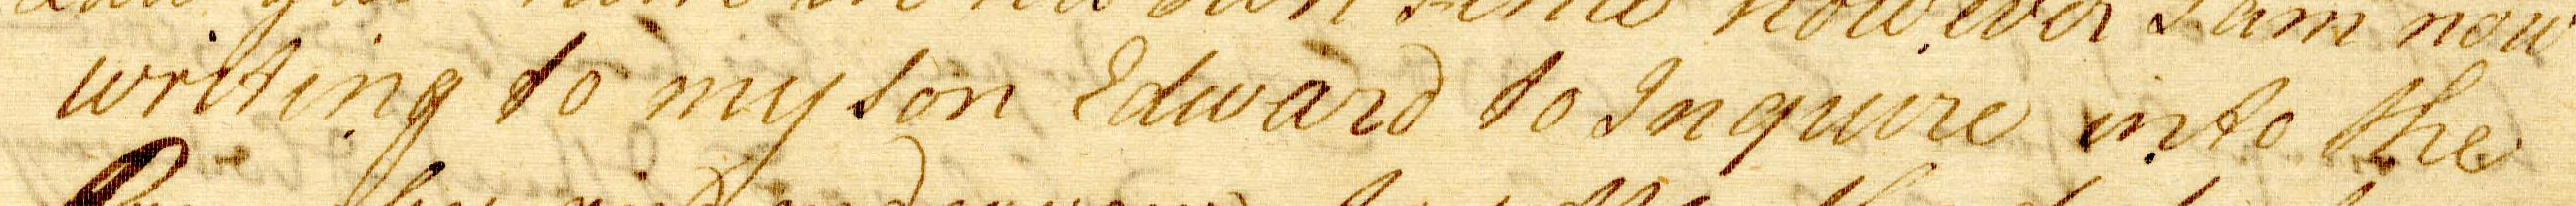writing to my Son Edward to Inquire into the
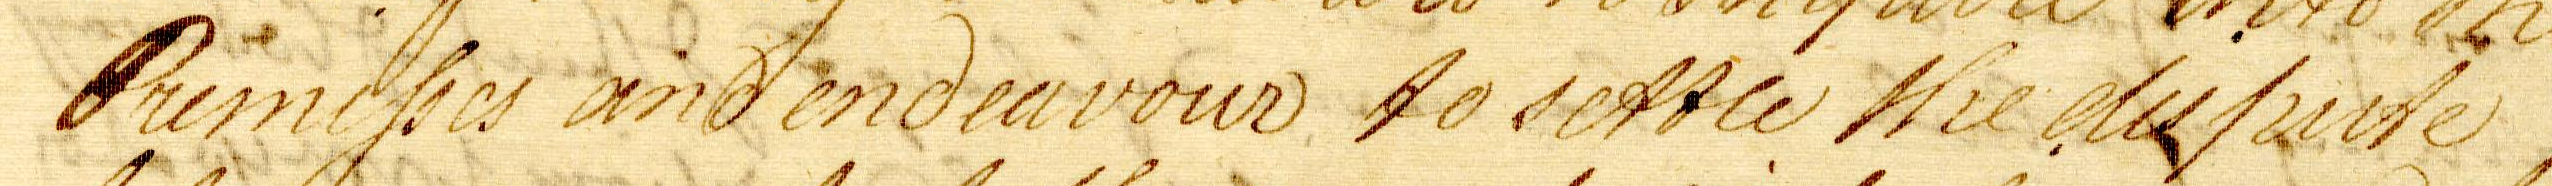Premisses and endeavour to settle the dispute
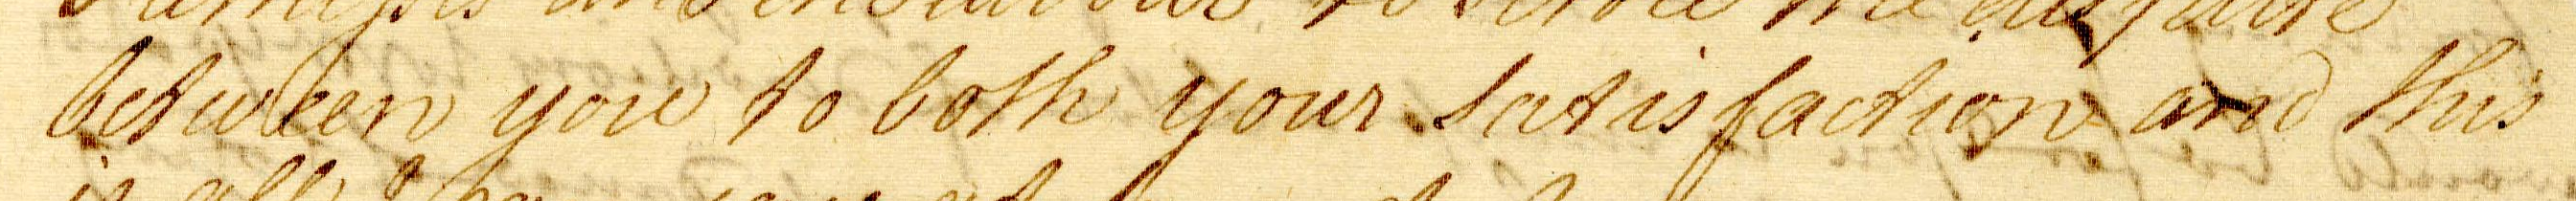between you to both your Satisfaction and this
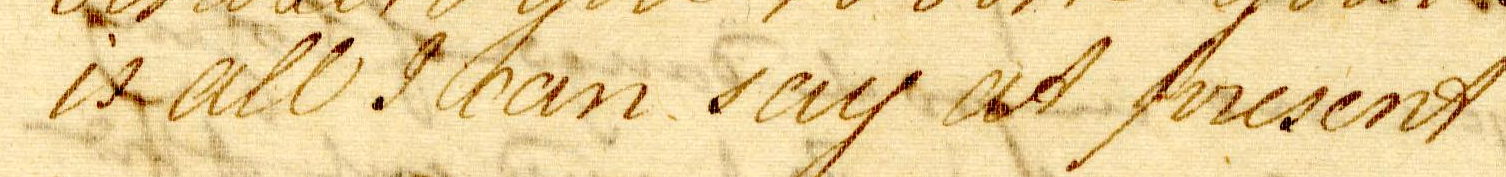is all I can say at present
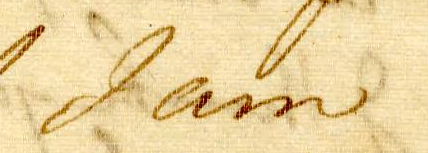I am
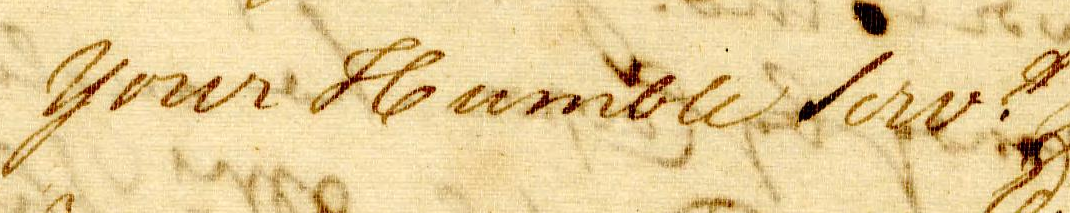Your Humble Serv^t.
